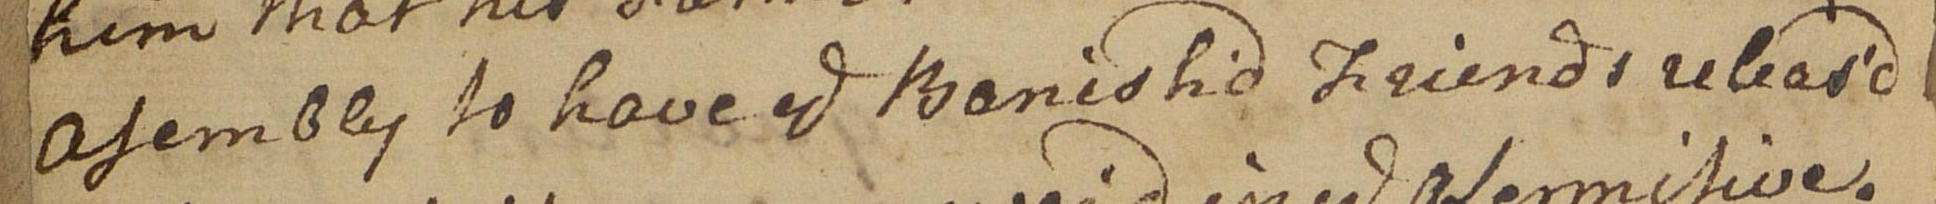Asembly to have y^e Banish'd Friends releas'd
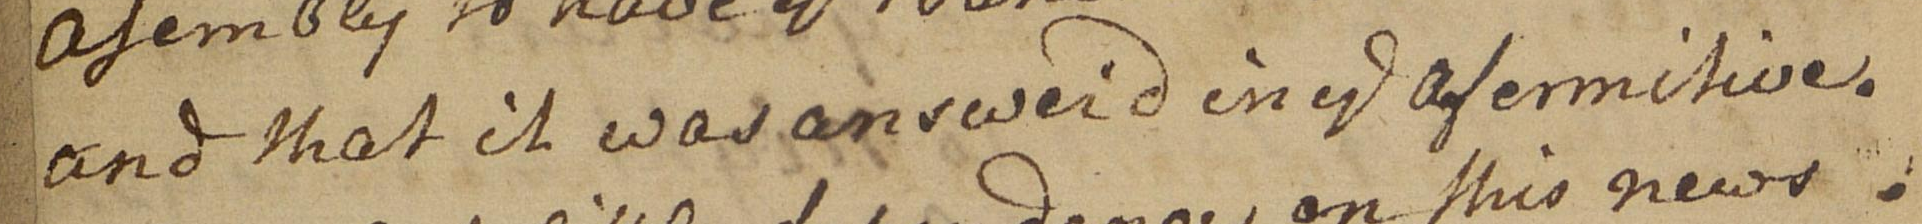and that it was answer'd in y^e Afermitive.
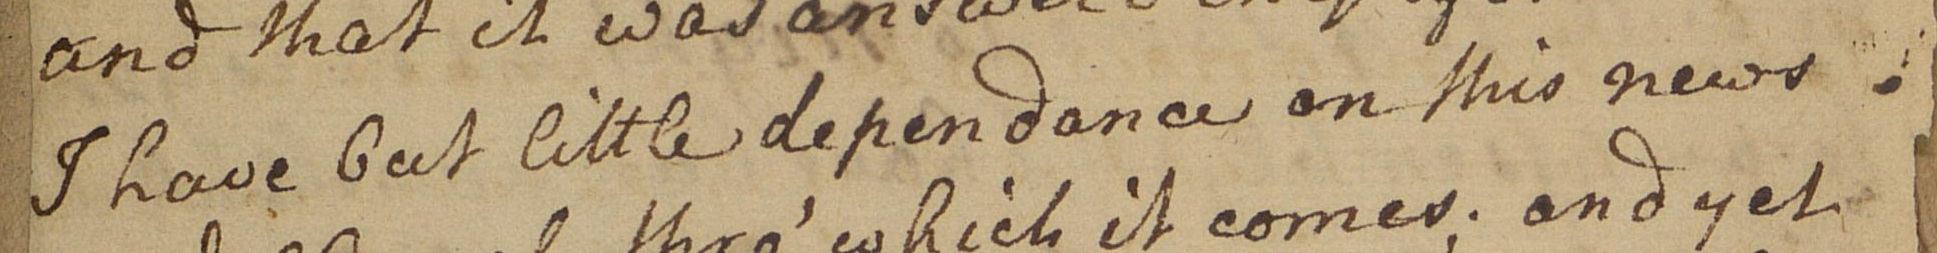I have but little depedance on this news.
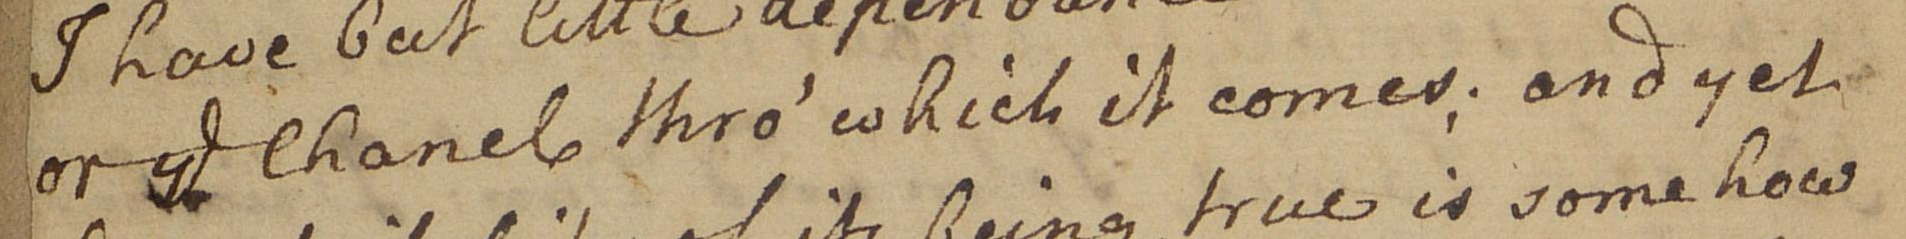or y^e Chanel thro' which it comes; and yet
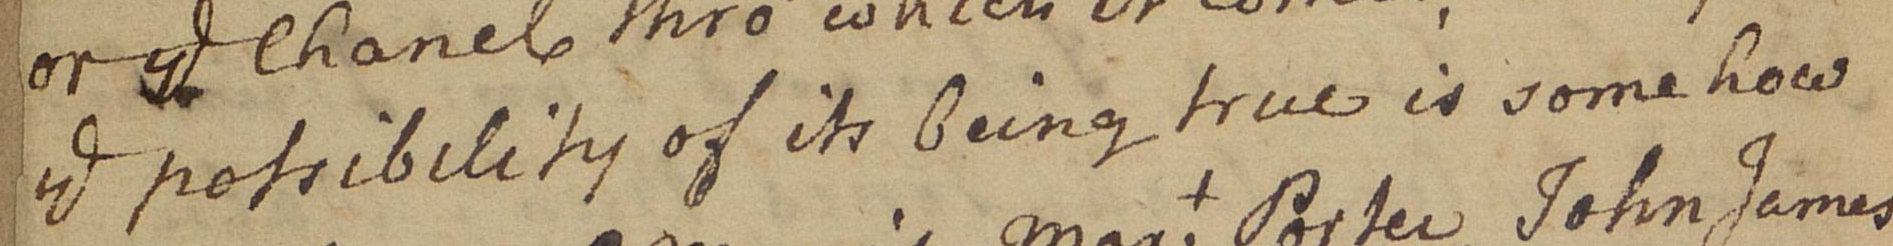y^e possibility of its being true is somehow
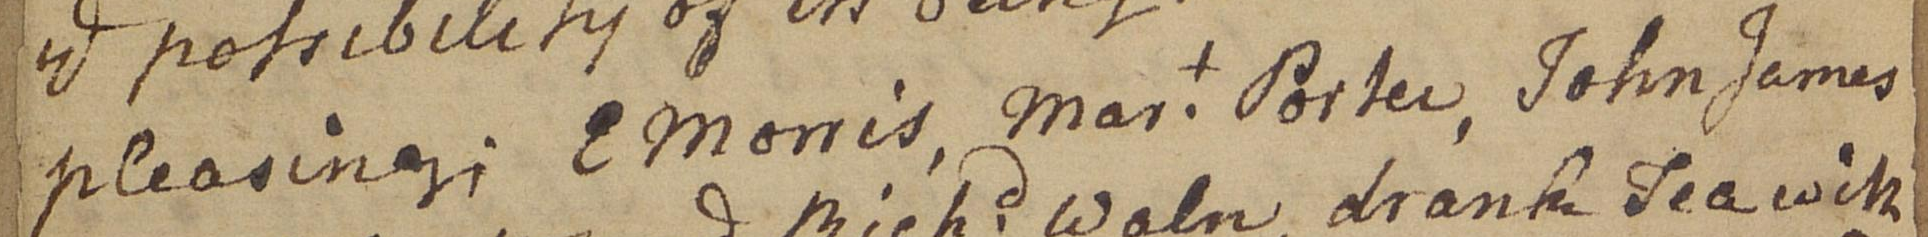pleasing; E Morris, Mar^t. Porter, John James
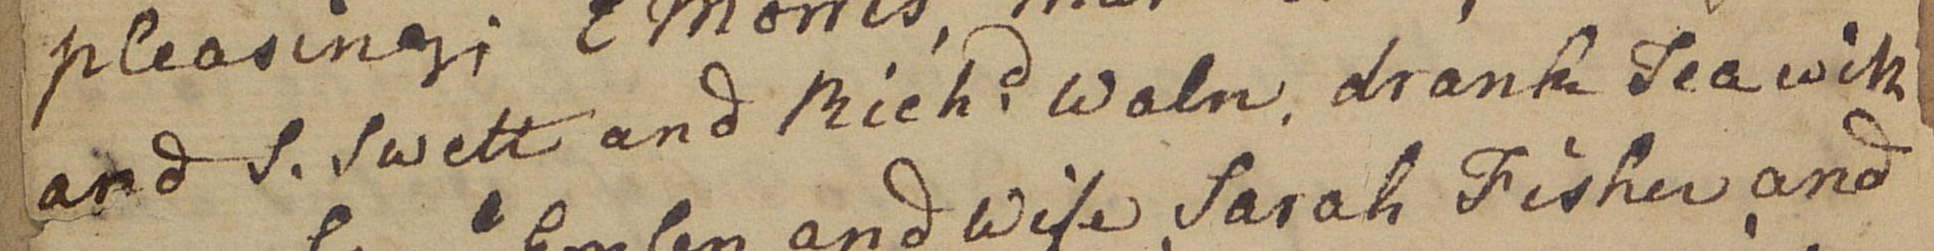and S. Swett and Rich^d. Waln, drank Tea with
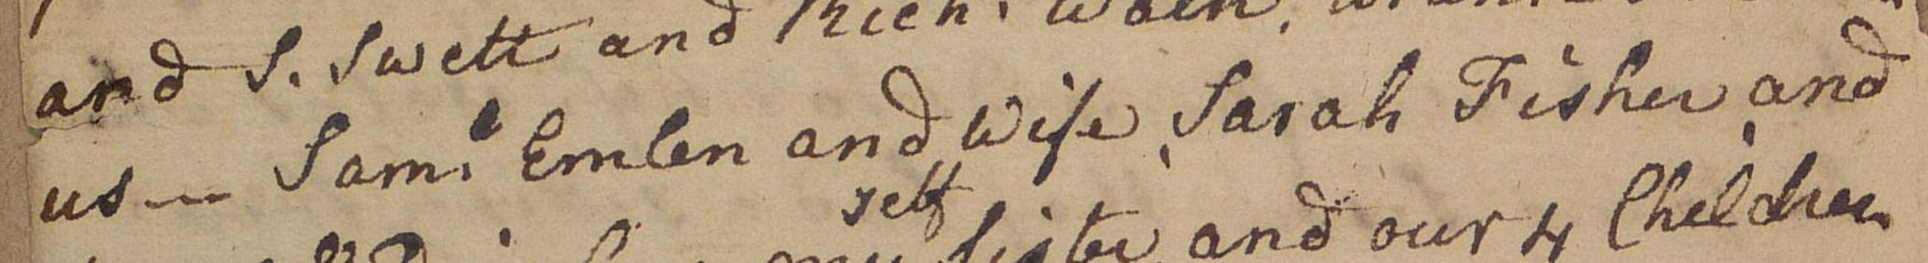us- Sam^l. Emlen and Wife, Sarah Fisher and
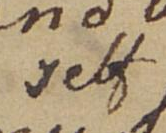self
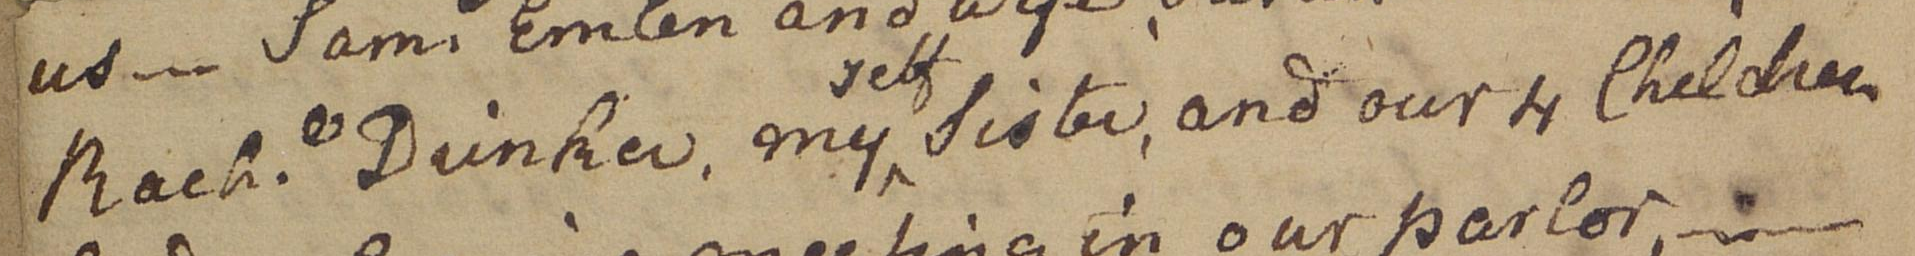Rach^l. Drinker, my ^ Sister, and our 4 Children
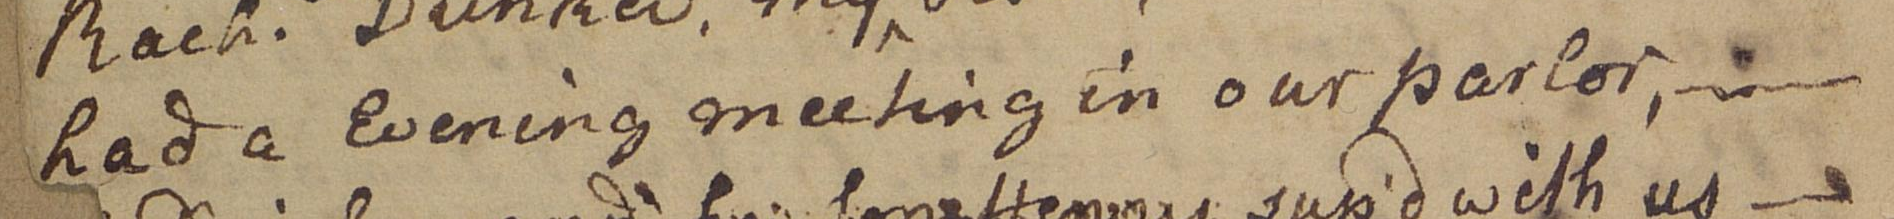had a Evening meeting in our parlor,-
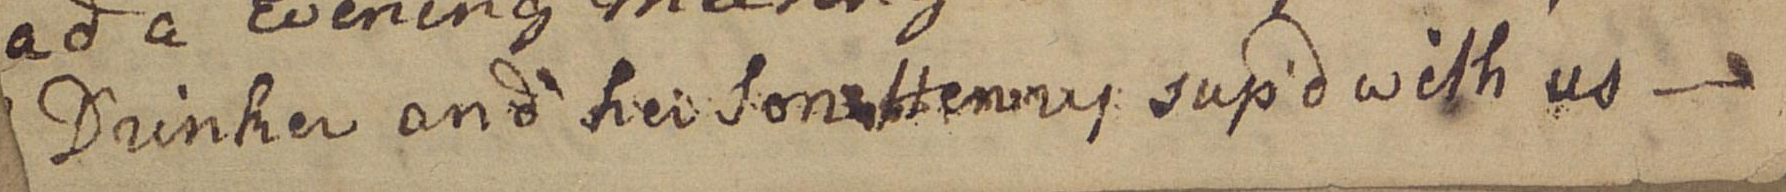Drinker and her Son Henry sup'd with us-
